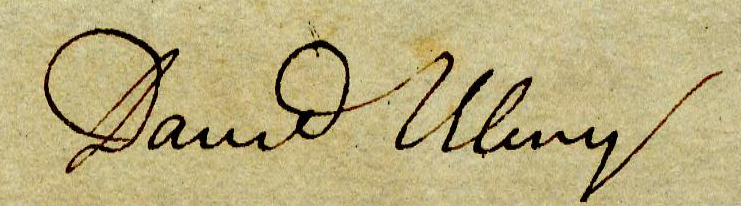David Uleny
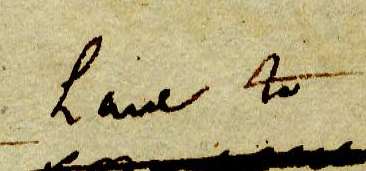have to
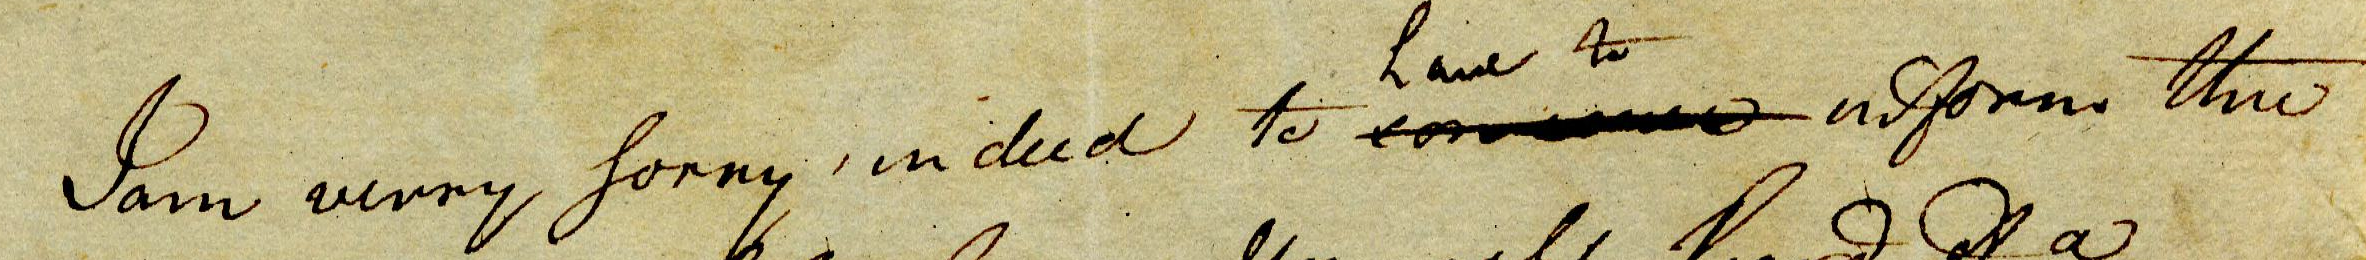I am verry sorry indeed to [________] inform thee
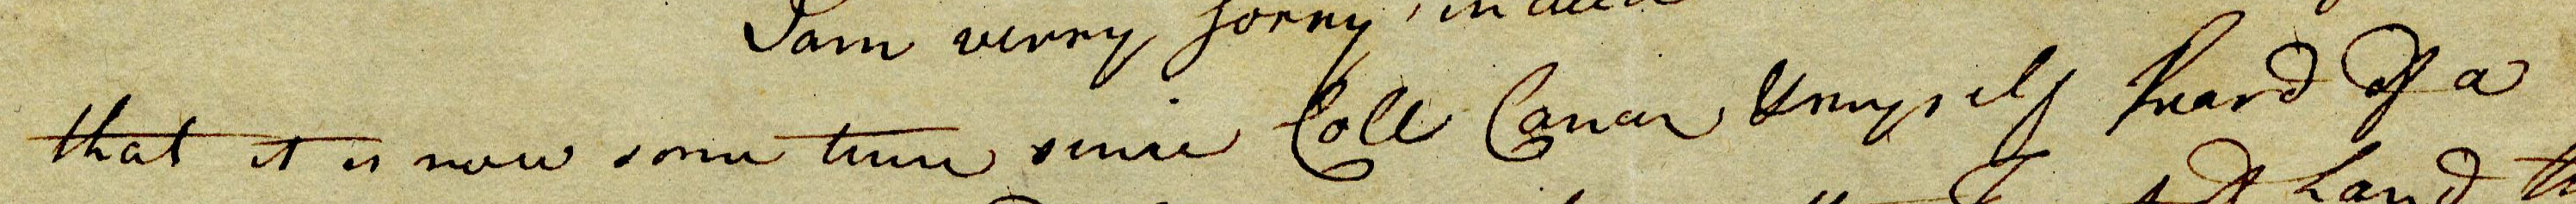that it is now some time since Coll Canan & myself heard of a
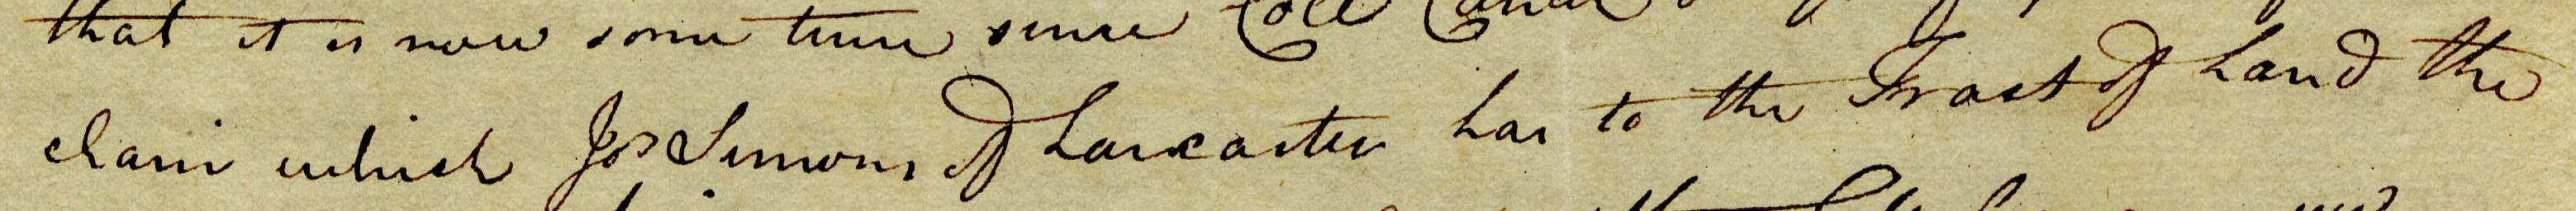claim which Jo^s Simons of Lancaster has to the tract of land the
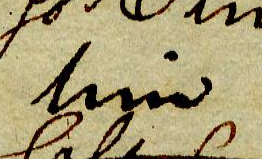him
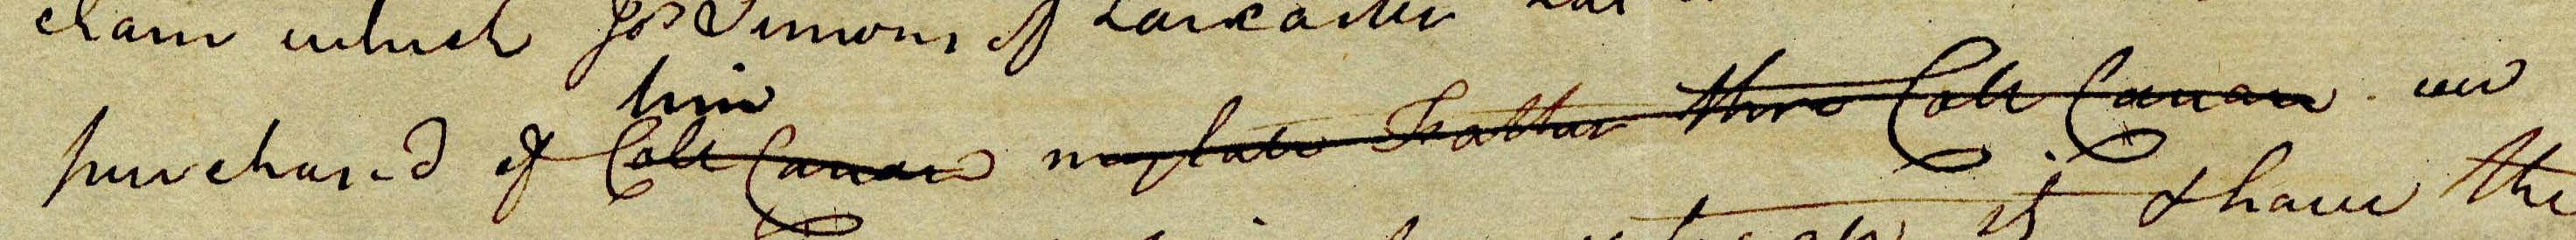purchased of [Coll Canan] [my late Father thro Coll Canan] we
